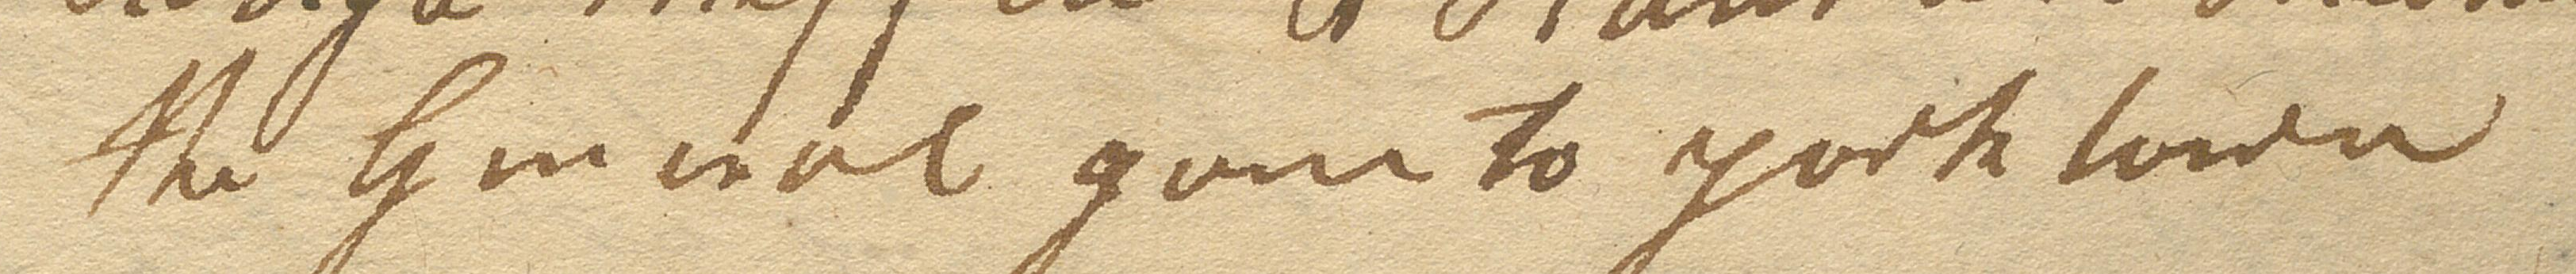the General gone to york town
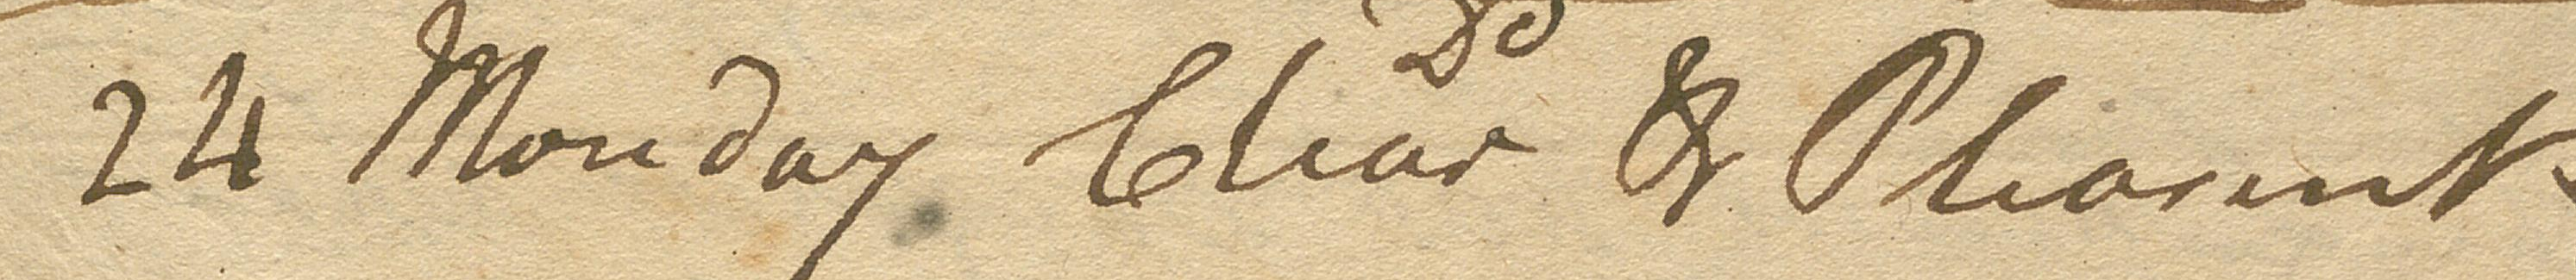24 Monday Clear & Pleasent
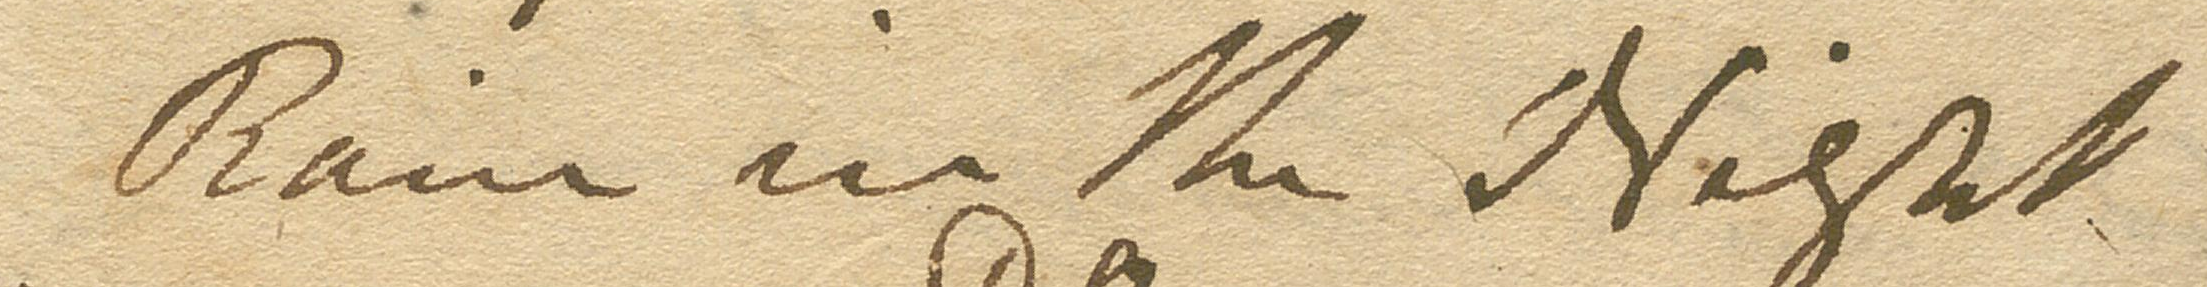Rain in the Night
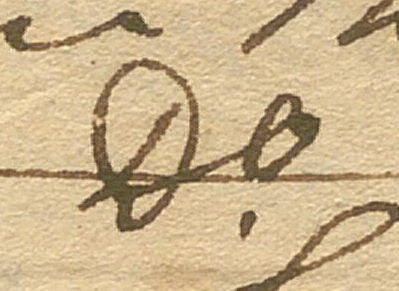D^o.
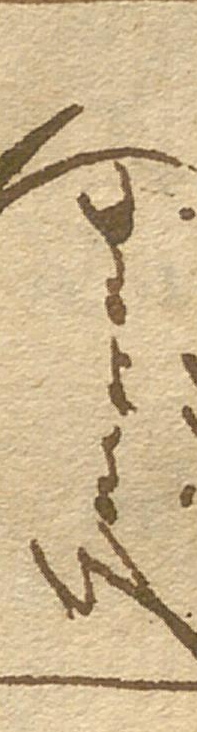General
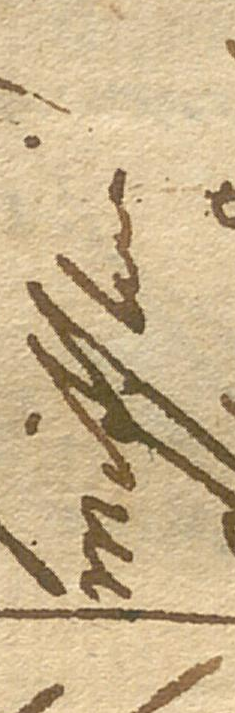mifflin
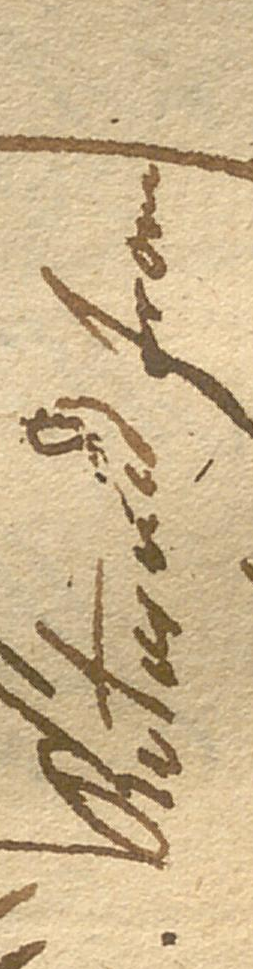Returned from
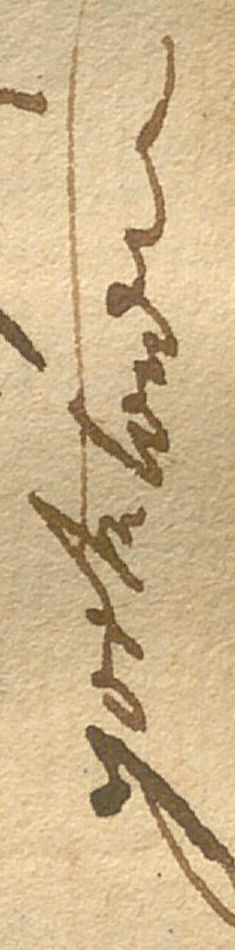yorktown
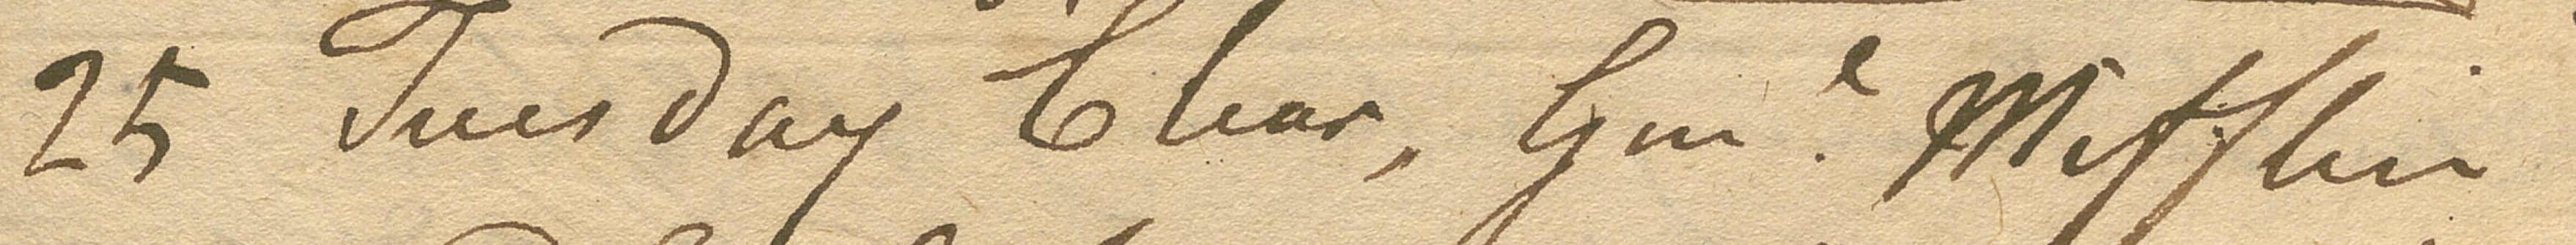25 Tuesday Clear, Gen^l. Mifflin
